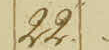22.
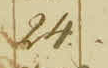24.
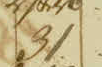31.
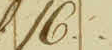16.
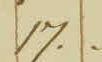17.
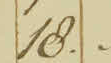18.
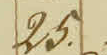25.
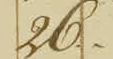26.
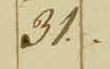31.
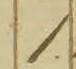1.
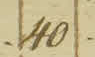40
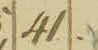41.
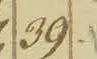39
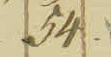54
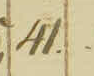41.
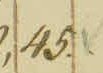45.
